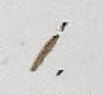1.
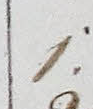1
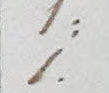1.
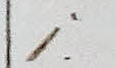1.
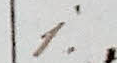1.
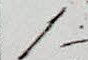1
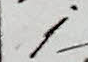1
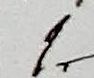1
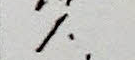1.
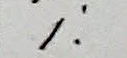1.
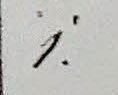1.
